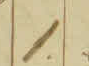1.
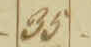35
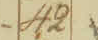42
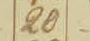20
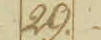29.
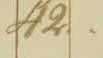42
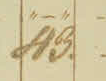43.
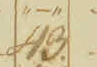43.
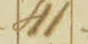41
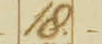18.
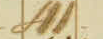41
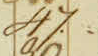47.
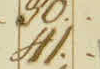41.
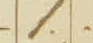1.
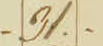31.
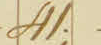41.
